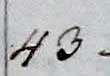43
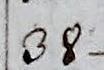38
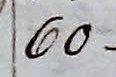60
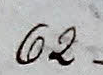62
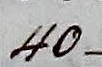40
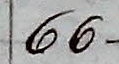66
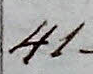41
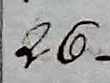26
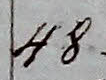48
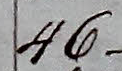46
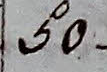50
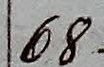68
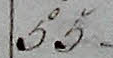55
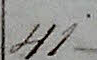41
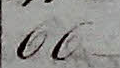66
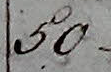50
